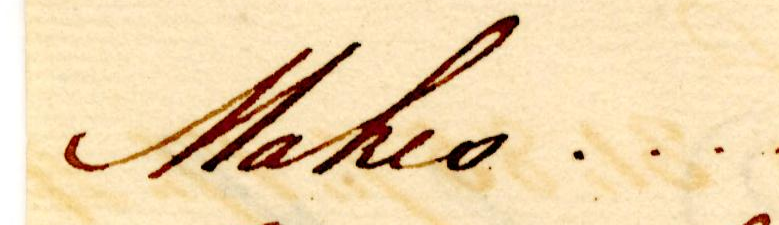Makes...
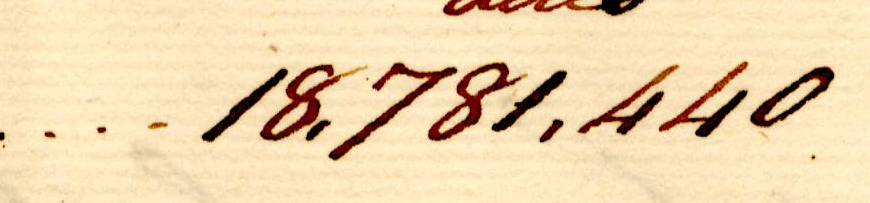18,781,440
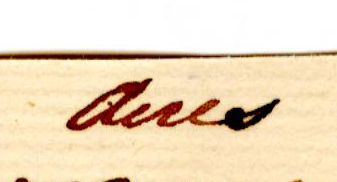Acres
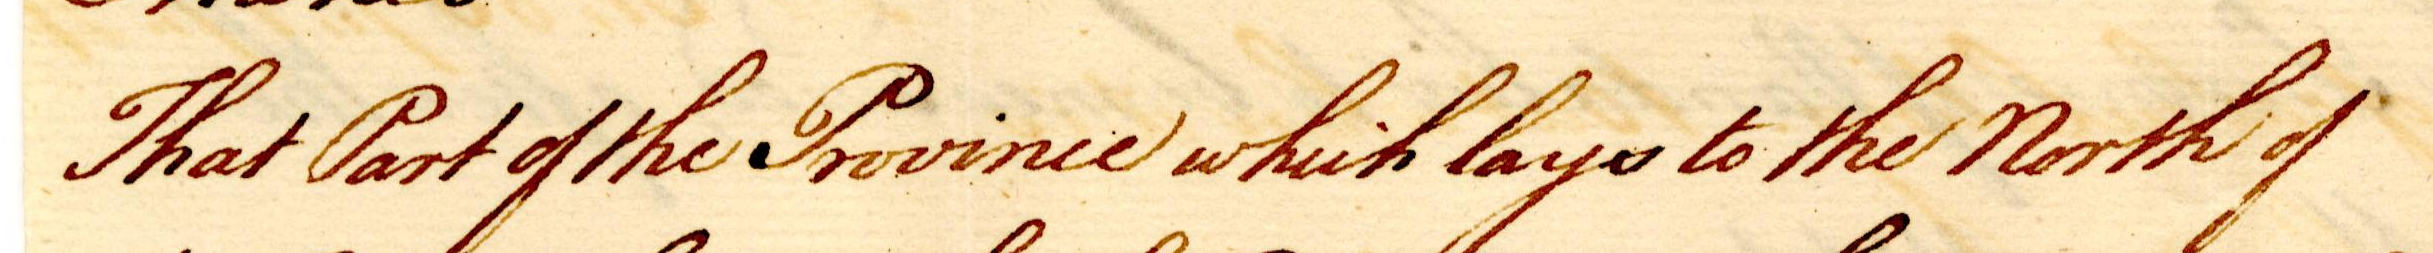That Part of the Province which lays to the North of
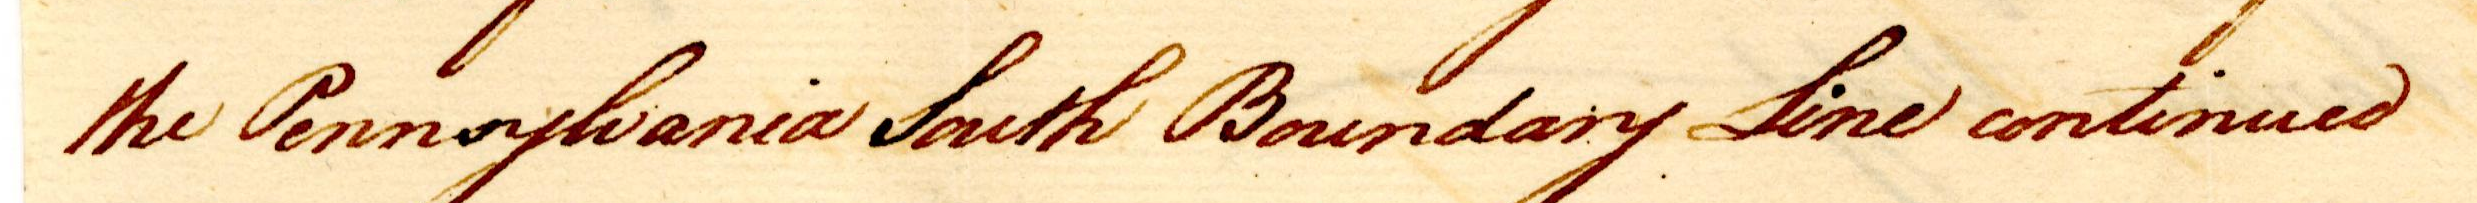the Pennsylvania South Boundary Line continued
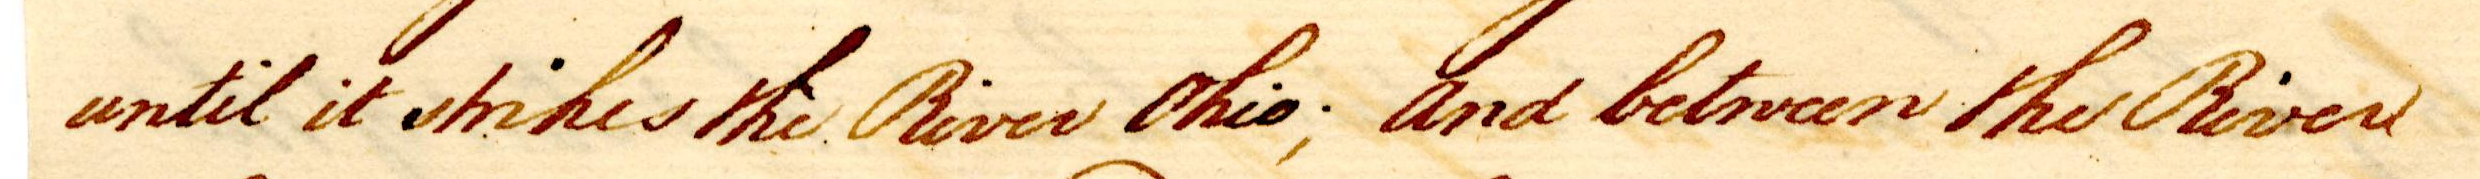until it strikes the River Ohio; and between the Rivers
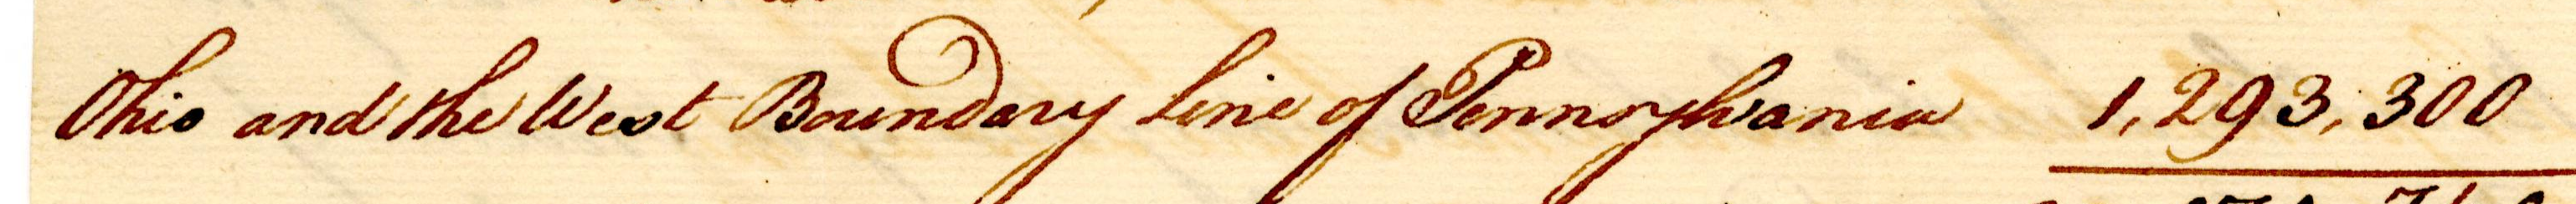Ohio and the West Boundary Line of Pennsylvania 1,293,300
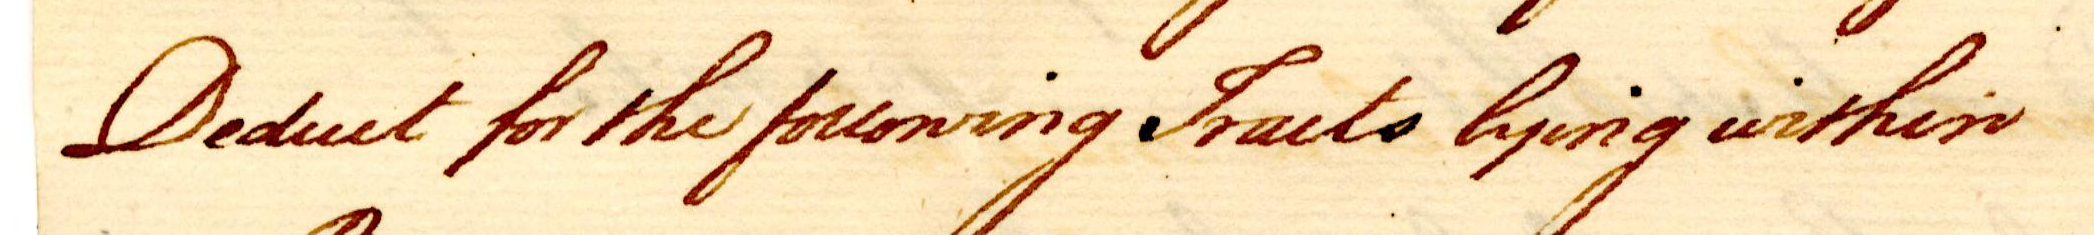Deduct for the Following Tracts lying within
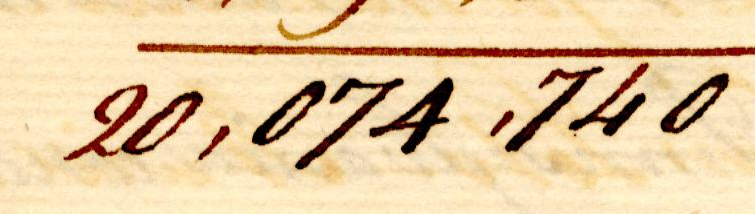20,074,740
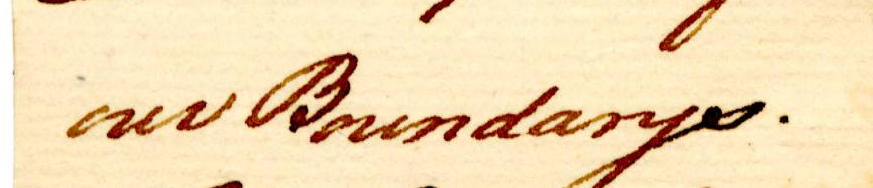on Boundarys
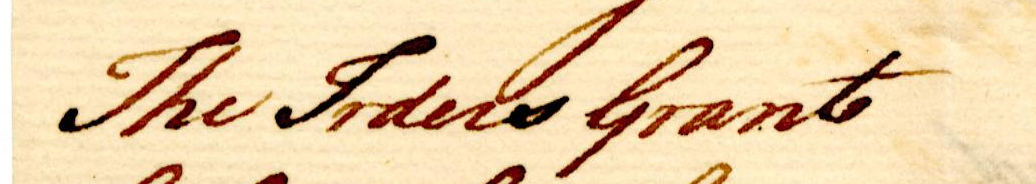The Trders Grant
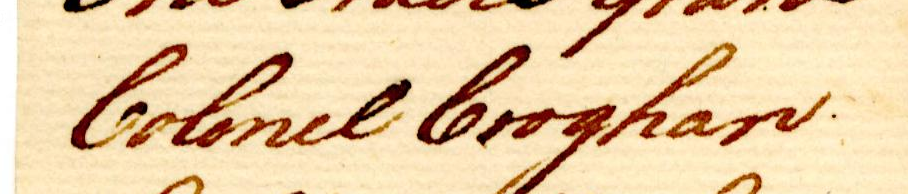Colonel Croghan.
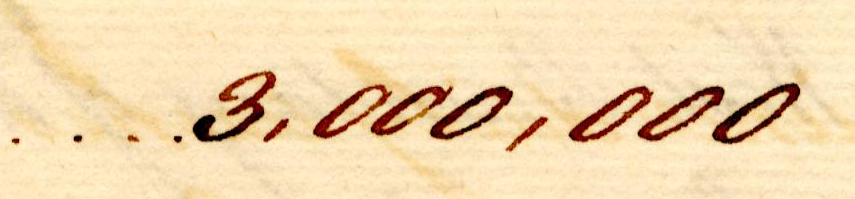3,000,000
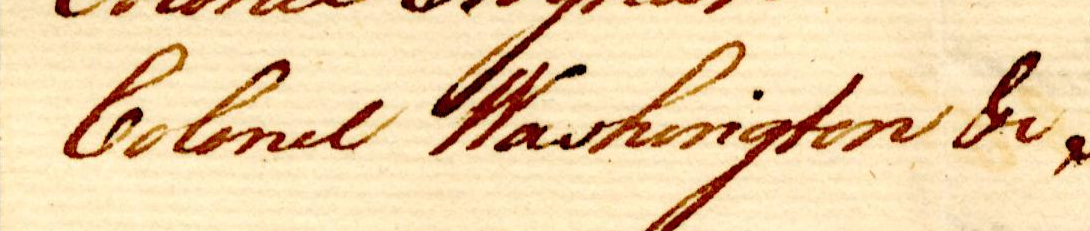Colonel Washington &c
